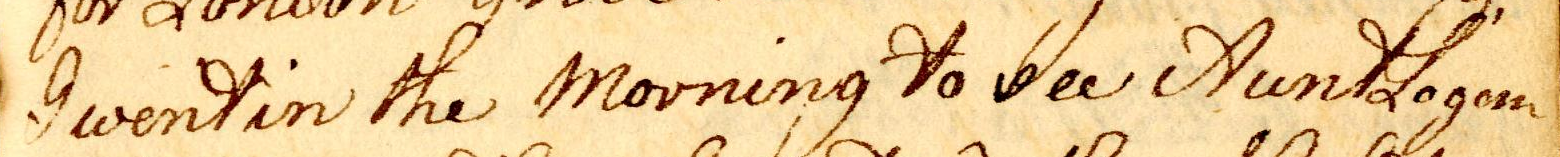I went in the Morning to see Aunt Logan
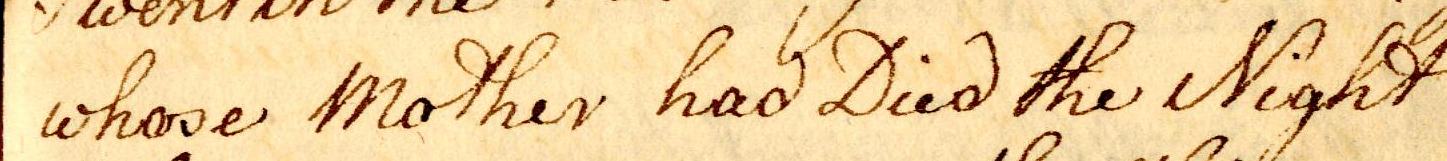whose Mother had died the Night
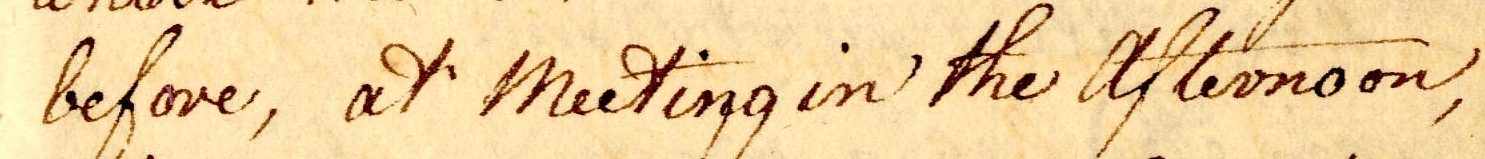before, at Meeting in the Afternoon,
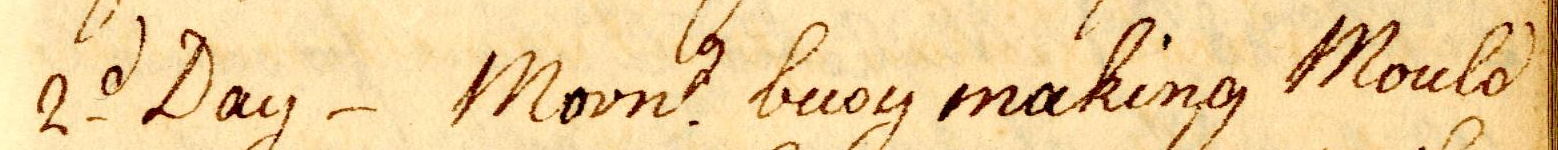2^d Day- Morn^g. busy making Mould
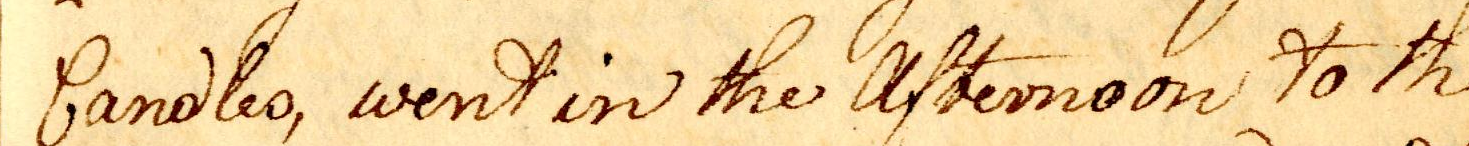Candles, went in the Afternoon to the
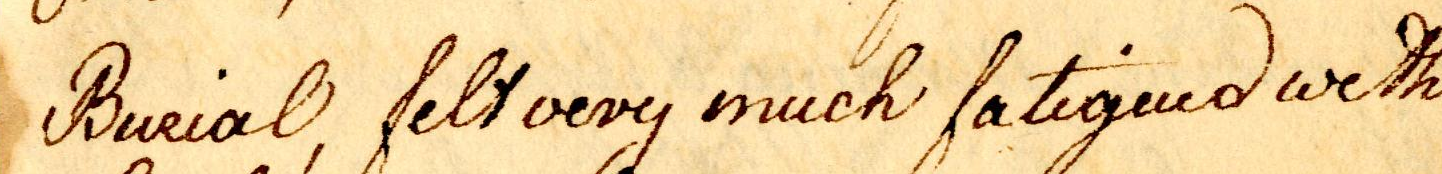Burial, felt very much fatigued with
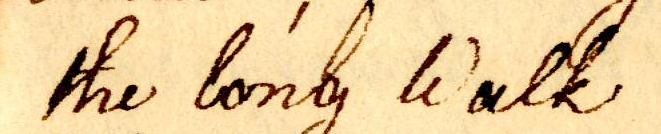the long Walk
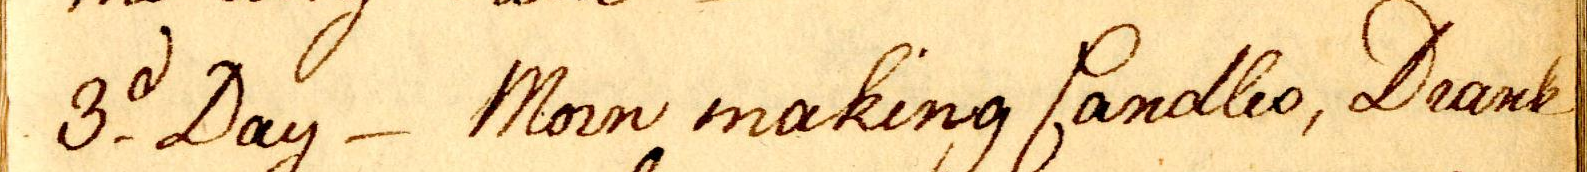3^d. Day- Morn making Candles, Drank
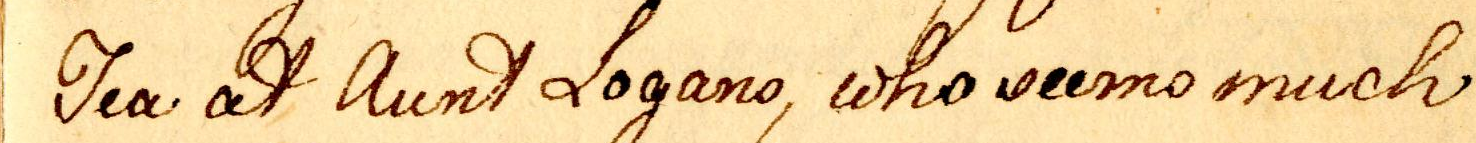Tea at Aunt Logans, who seems much
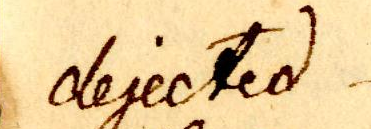dejected
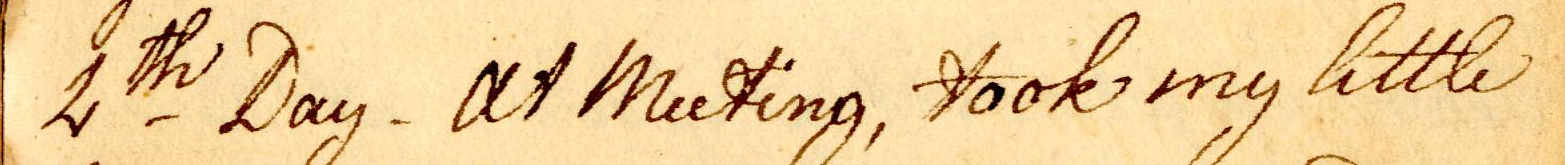4^th Day. At Meeting, took my little
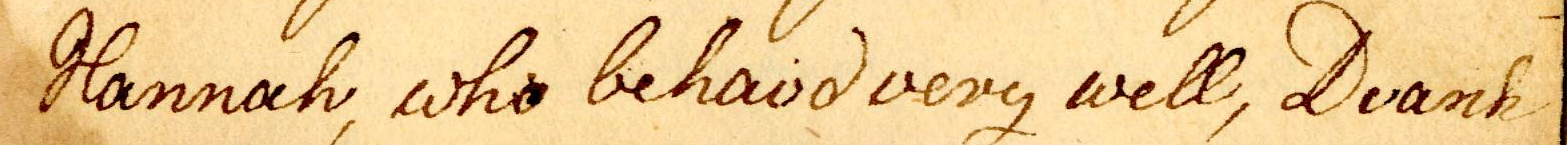Hannah, who behavd very well, Drank
